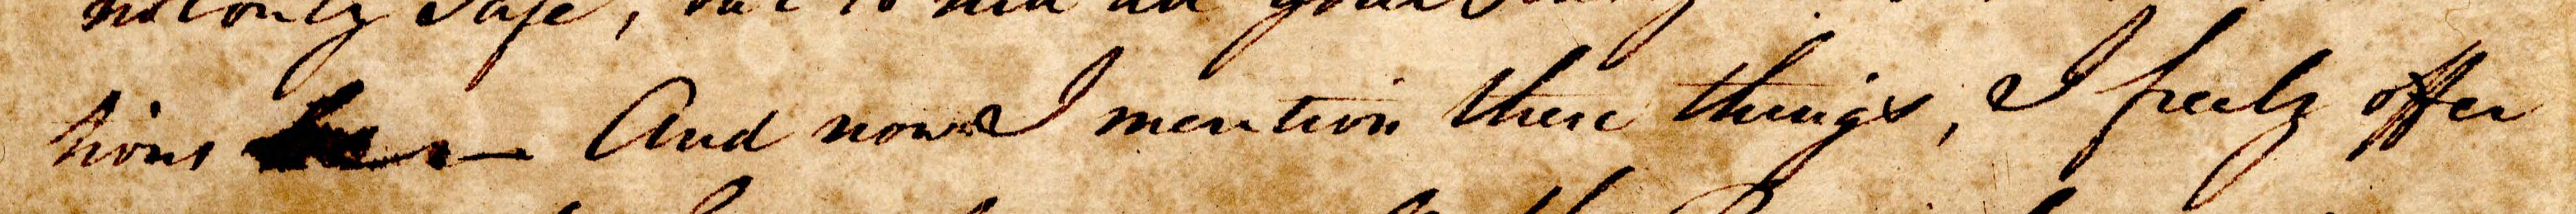-tious. And now I mention these things, I freely offer
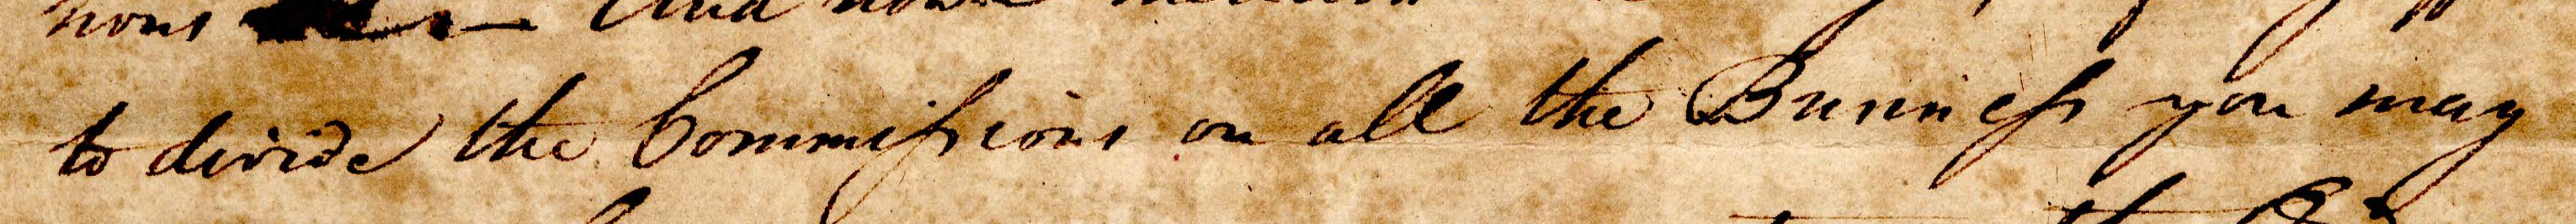to divide the Commissions or all the Business you may
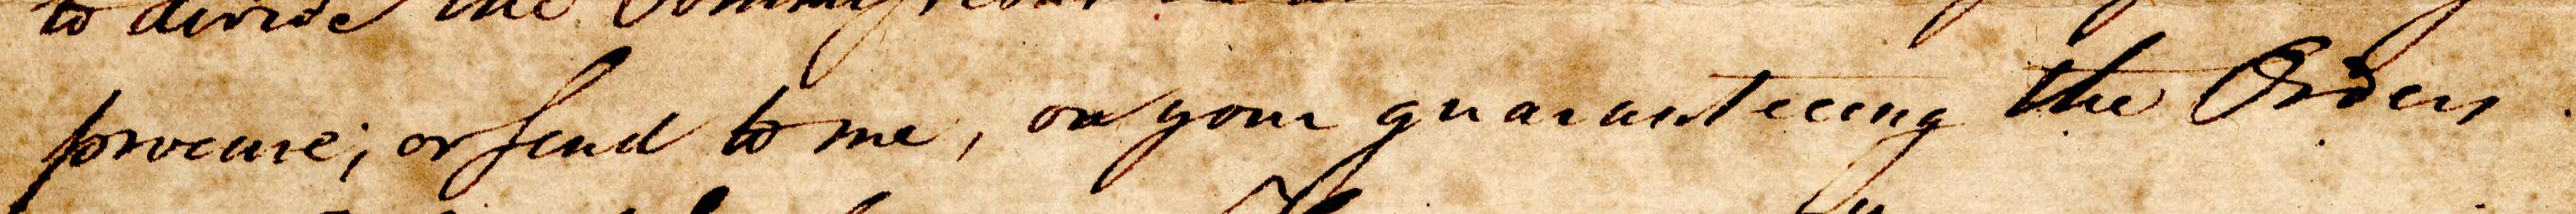procure; or send to me, on your guaranteeing the Orders
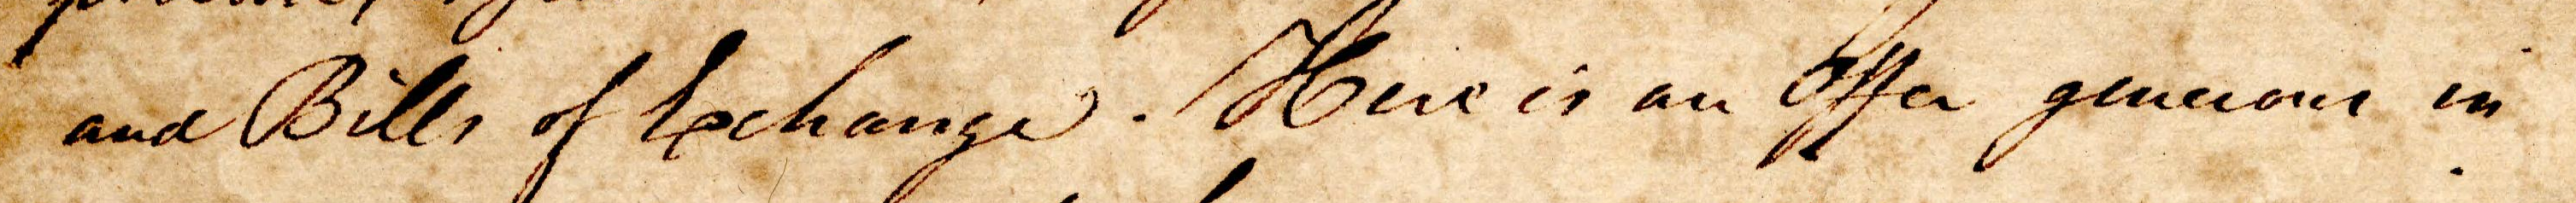and Bills of Exchange. Here is an Offer generous in
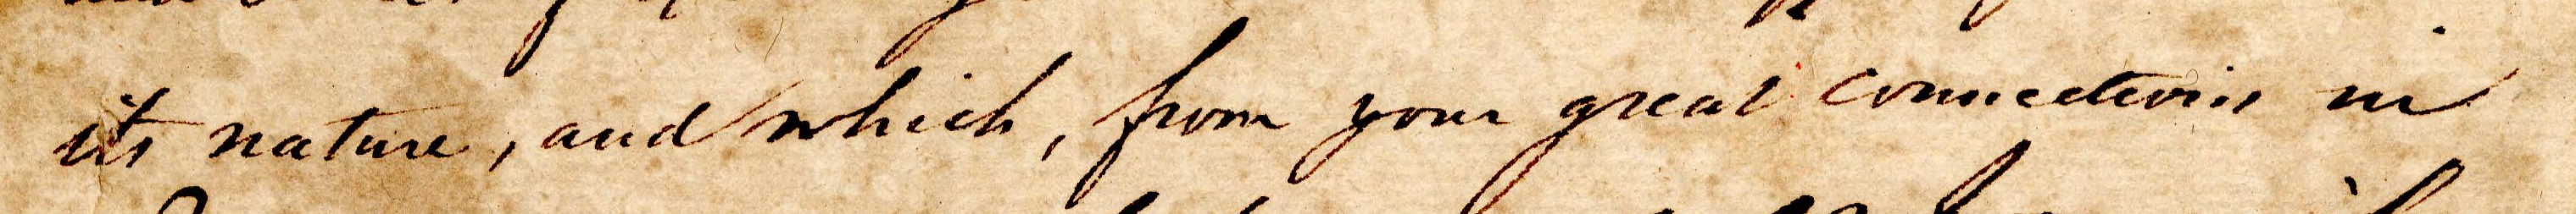its nature, and which, from your great connections in
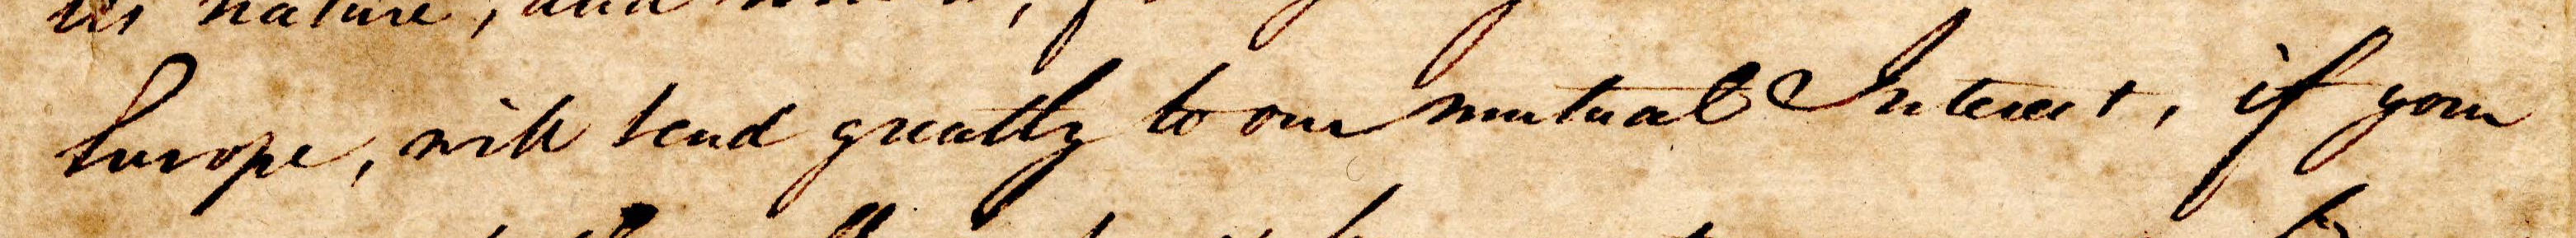Europe, will tend greatly to our mutual Interest, if you
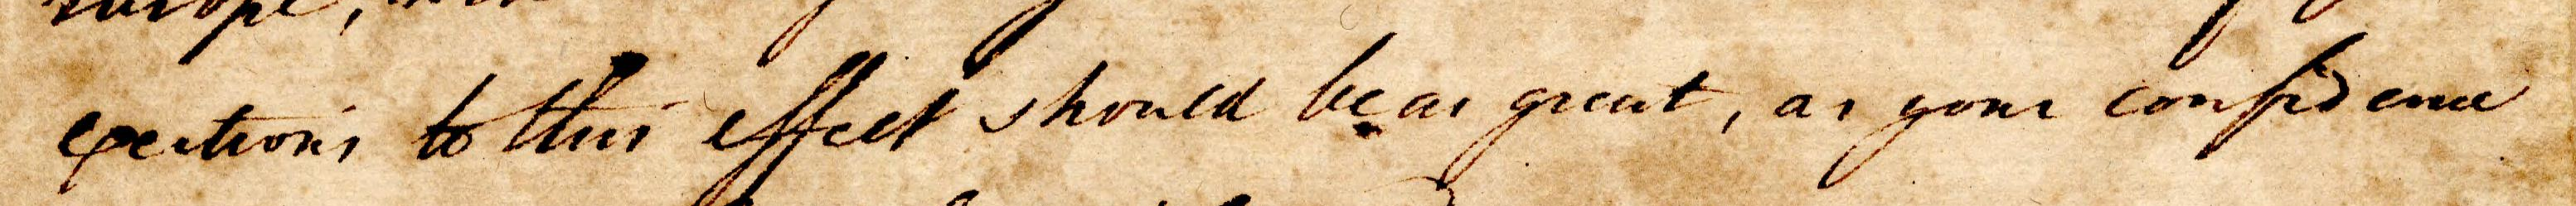petitions to this effect should be as great, as your confidence
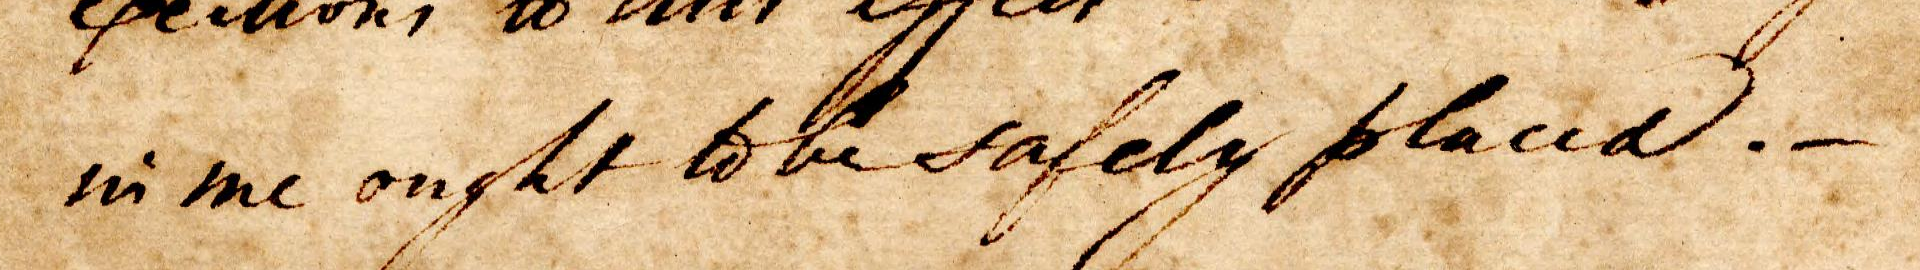in me ought to be safely placed.-
